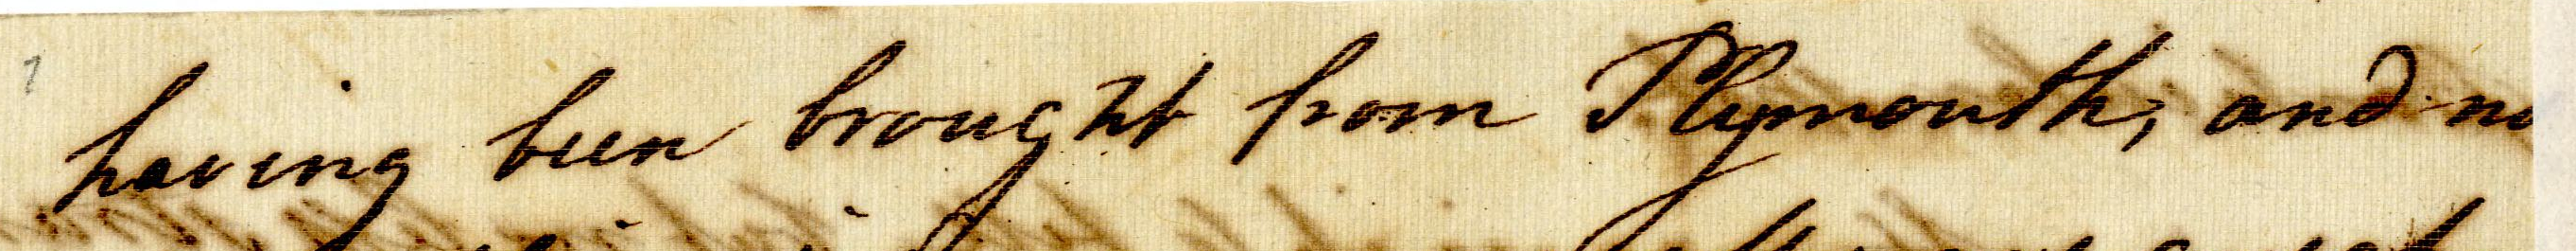having been brought from Plymouth, and no
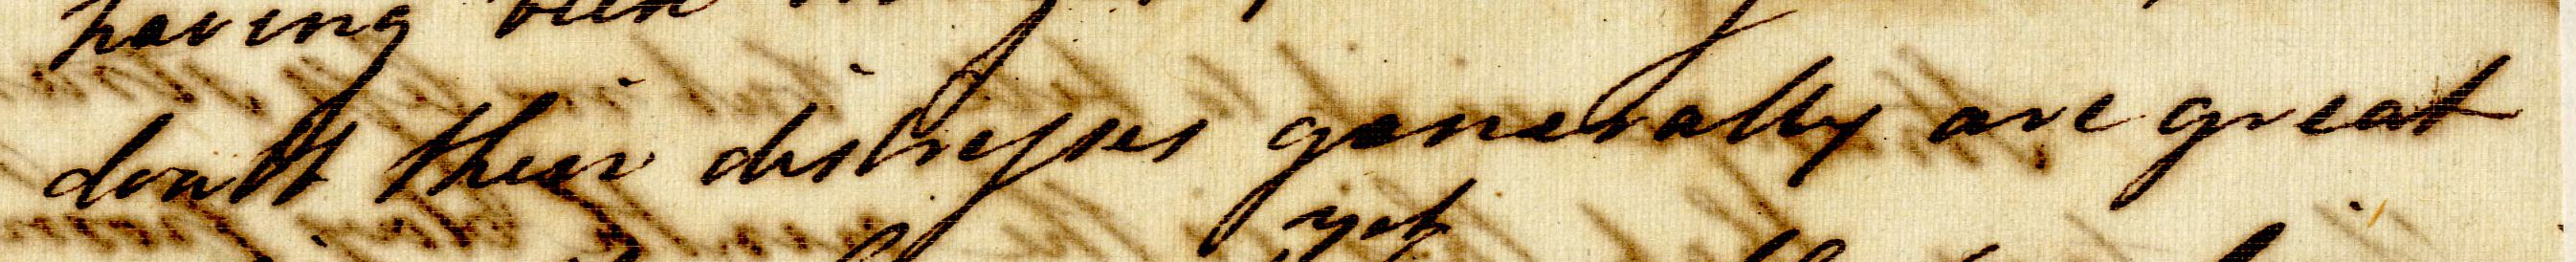doubt their distresses generally are great
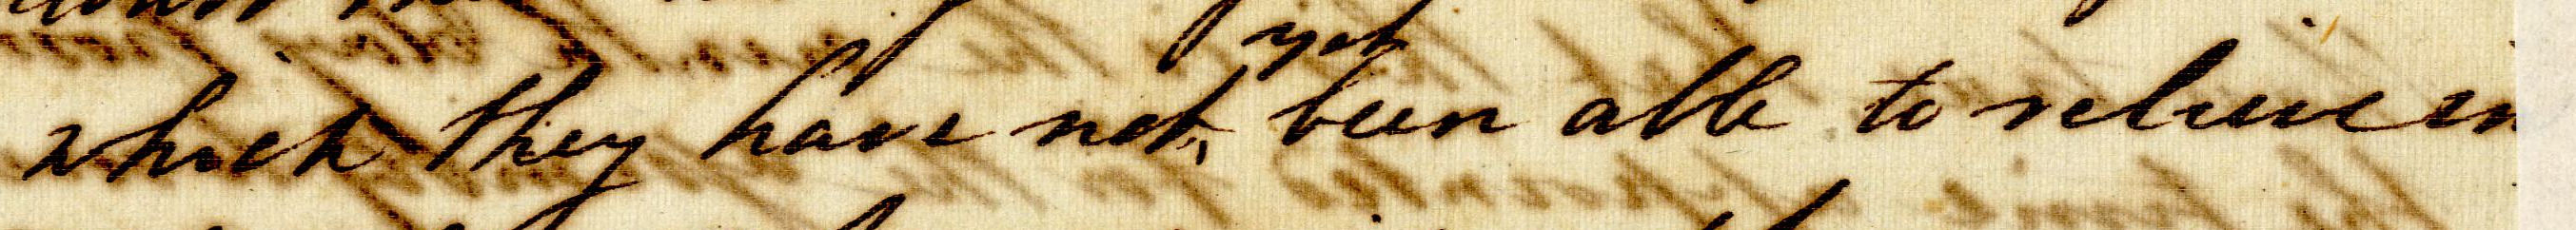which they have not ^yet been able to relieve in
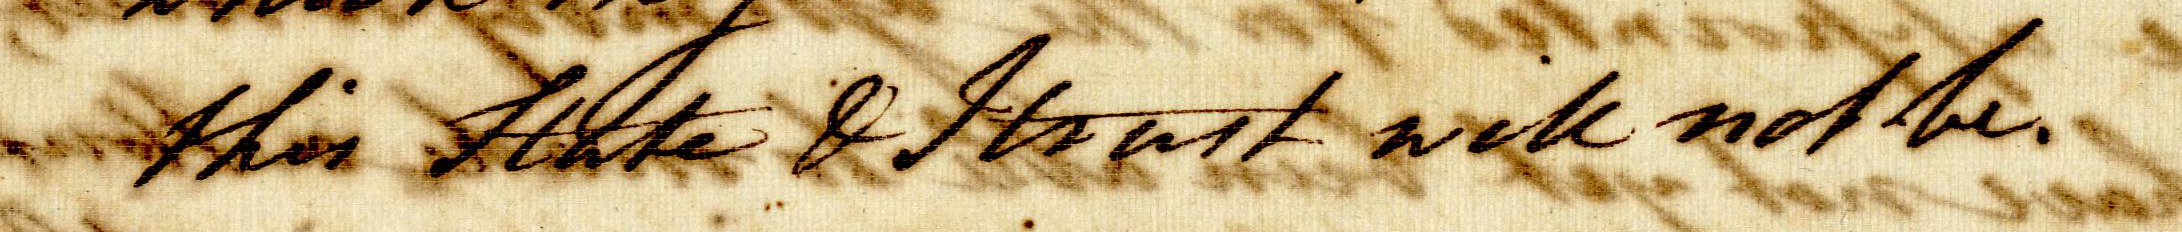this State & I trust will not be.
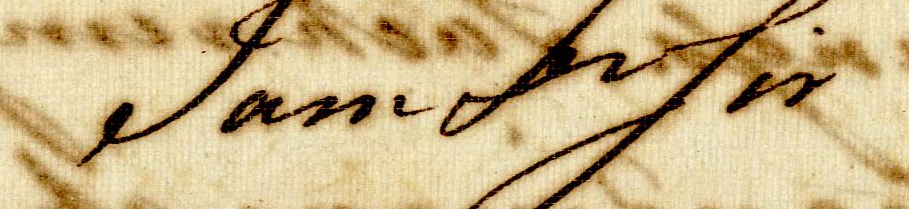I am D^r Sir
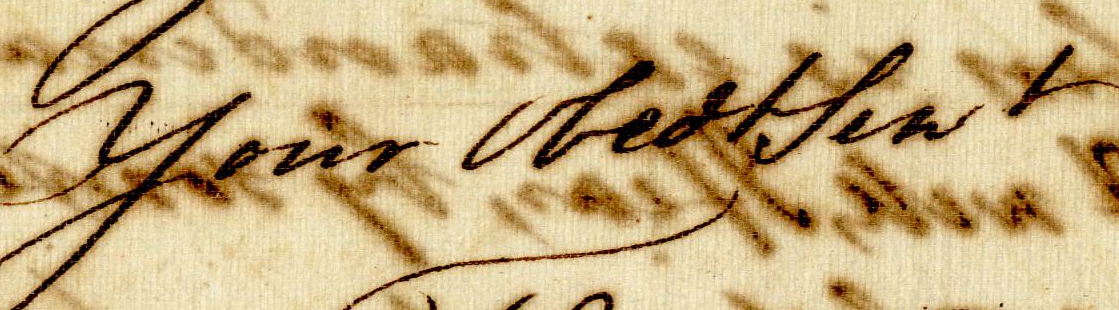Your Obedt Serv^t
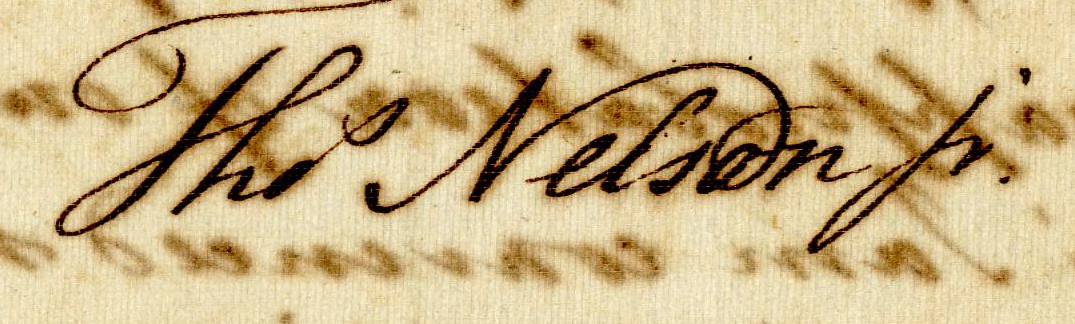Tho^s Nelson jr.
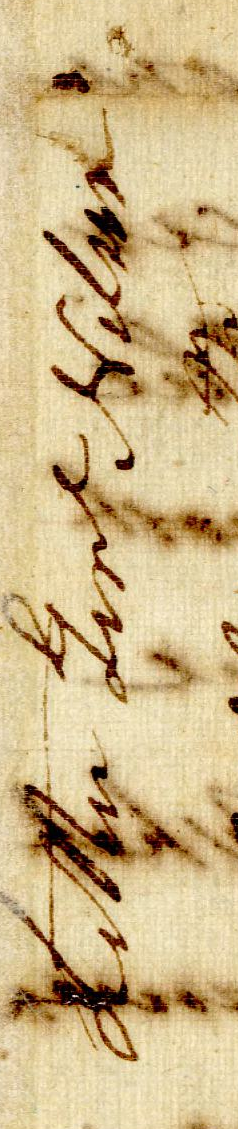Letter Gen^l Nelson
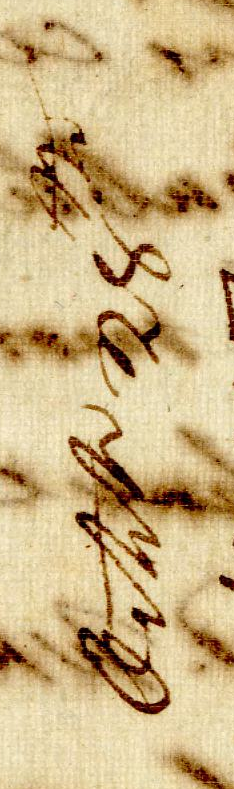Oct^r 28^th
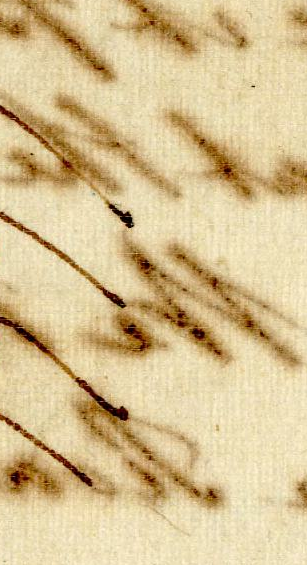1777
